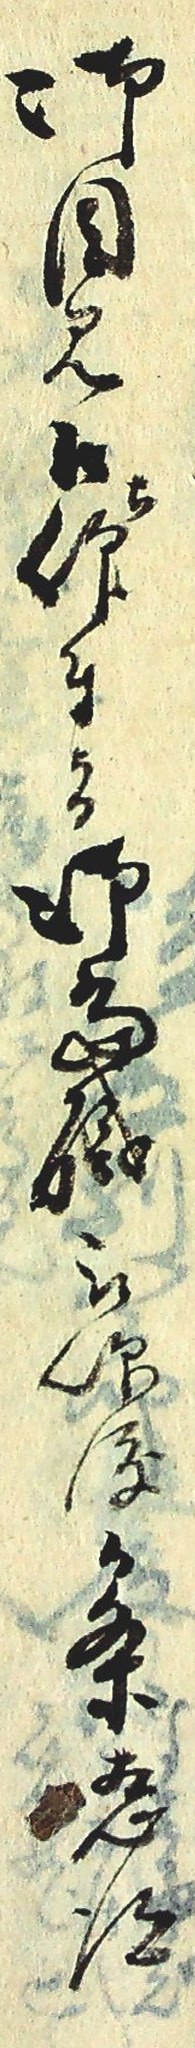御目見被為仰付旨御当職被仰渡候条相心得
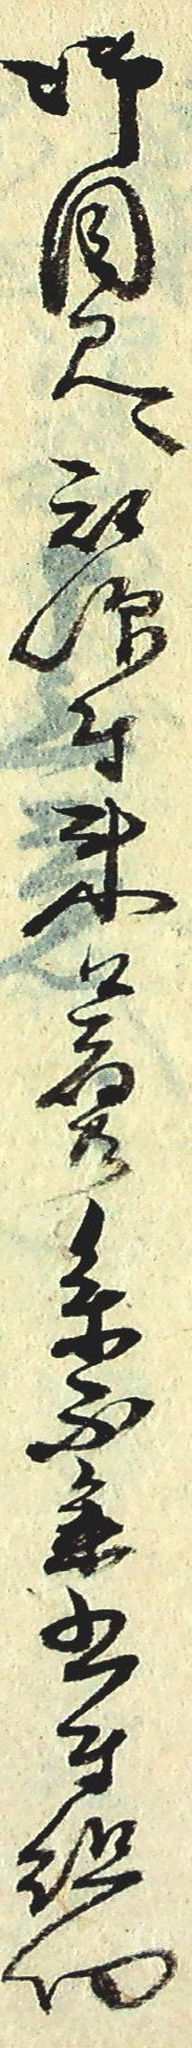御目見へ被仰付来候者共参不参書付組切
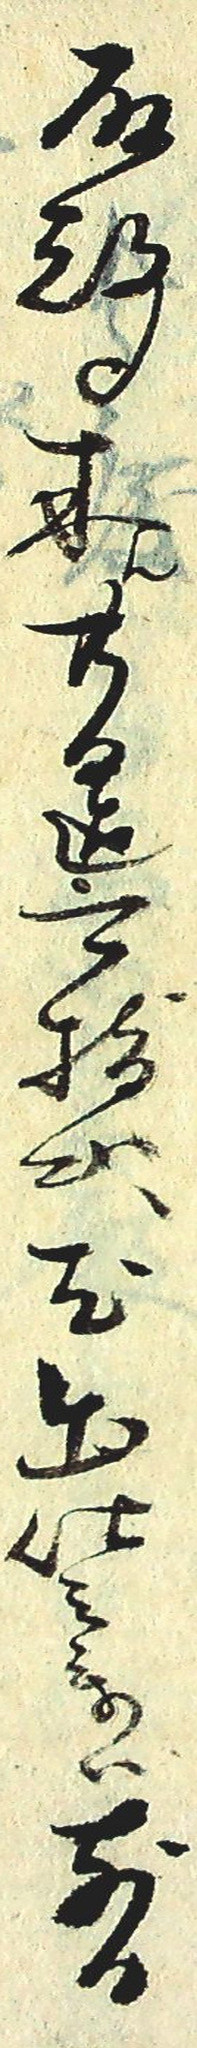取都め来る廿日迄可指出候尤出仕之義は前日
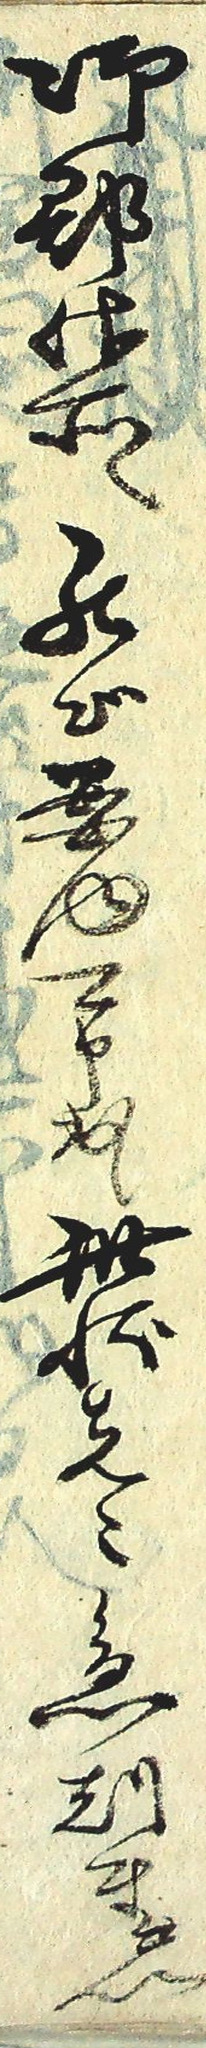御郡代所へ罷出案内可申出候此状先々急刻付を以
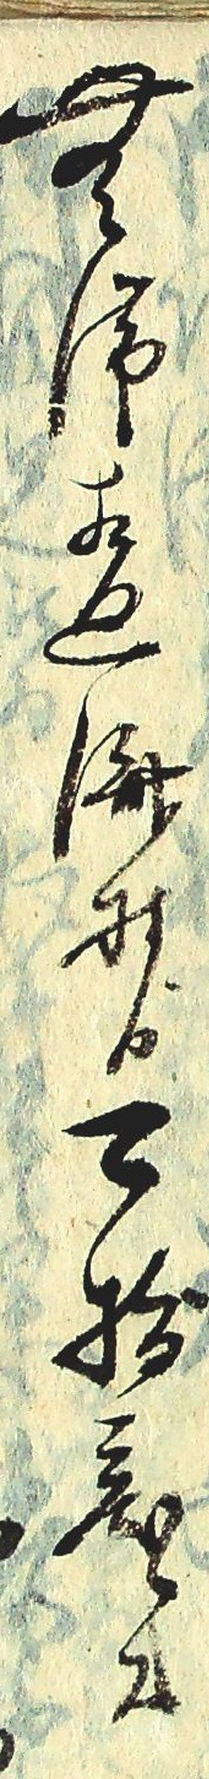無滞相廻済村ゟ可指戻候以上
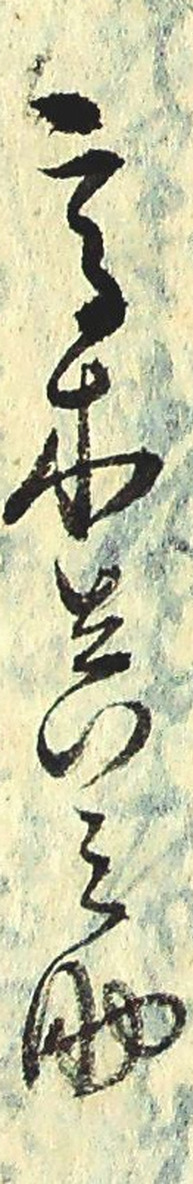高木真之助
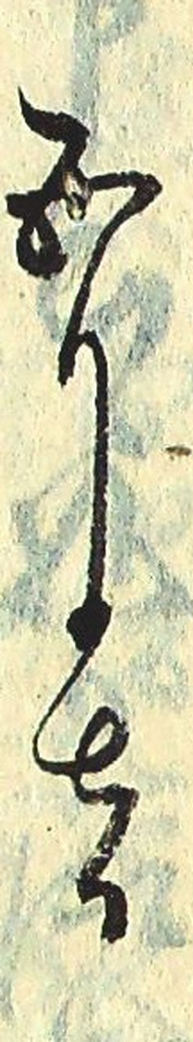五月七日
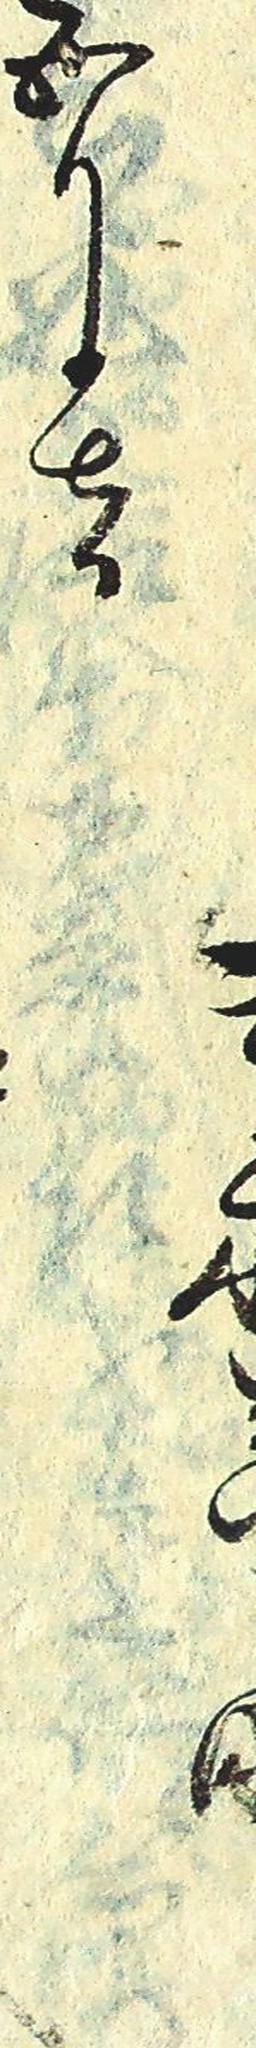五月七日
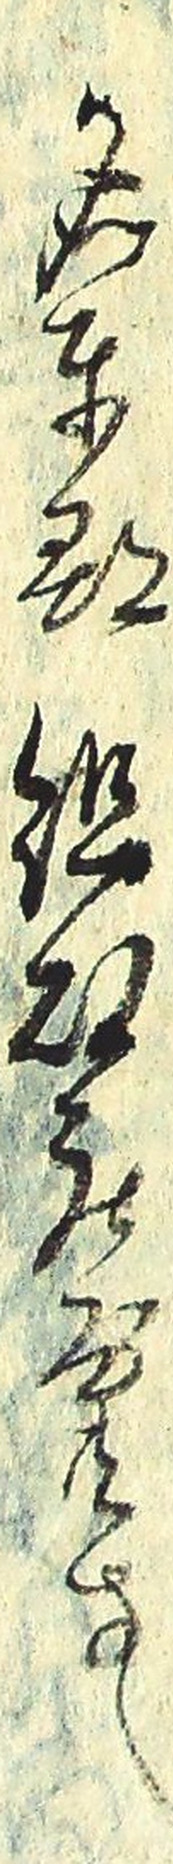名東郡組頭庄屋共方へ

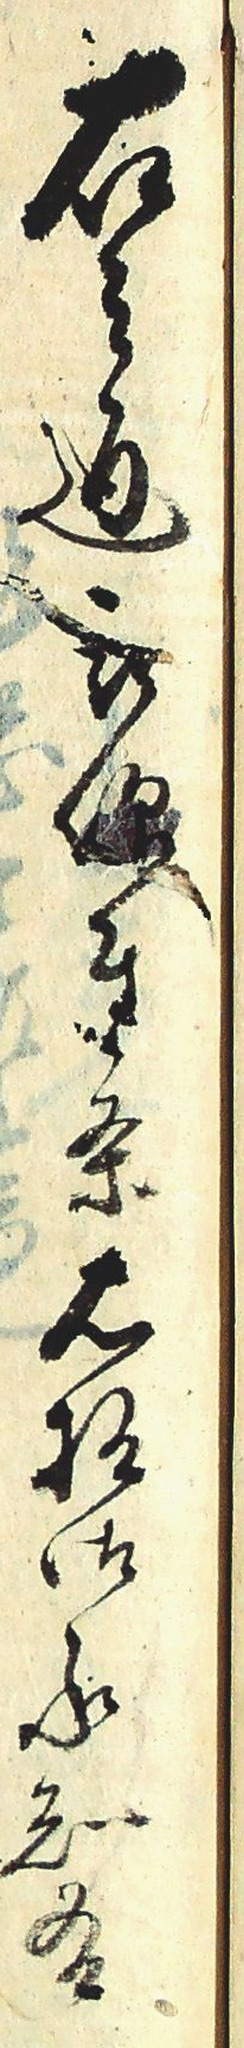右之通被仰付候条右様御承知各
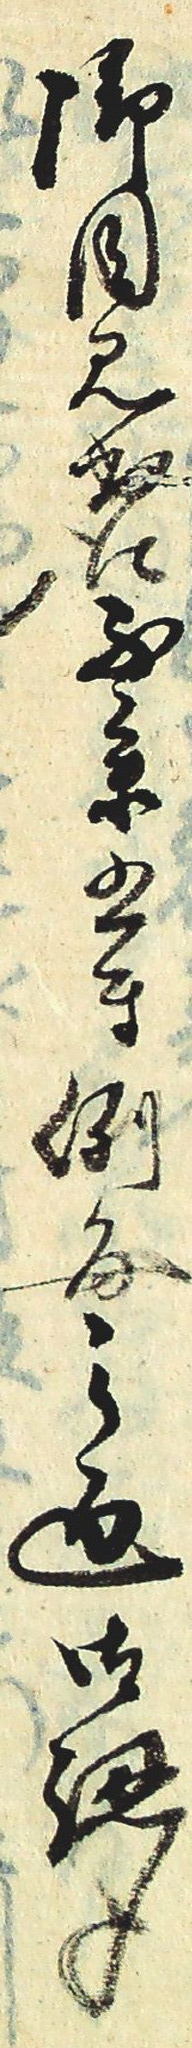御目見出仕不参書付例毎之通御認め
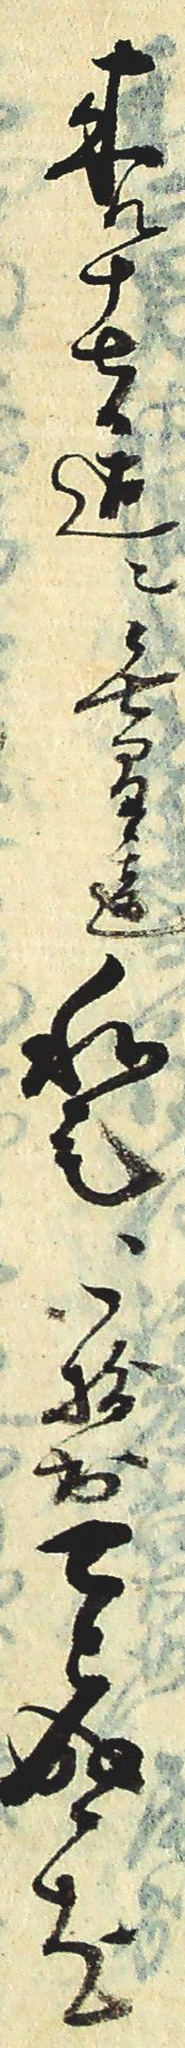来る十七日迄に無間違私宅へ御指出可被成候尤
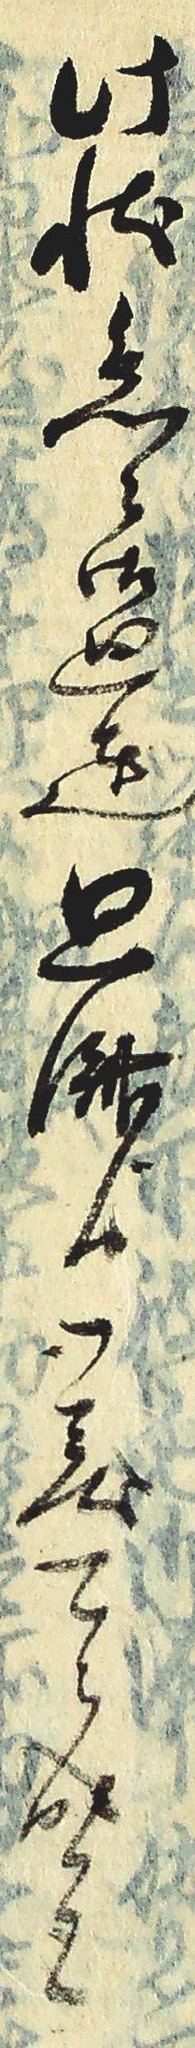此状急々御廻達廻済ゟ御戻可被成候以上
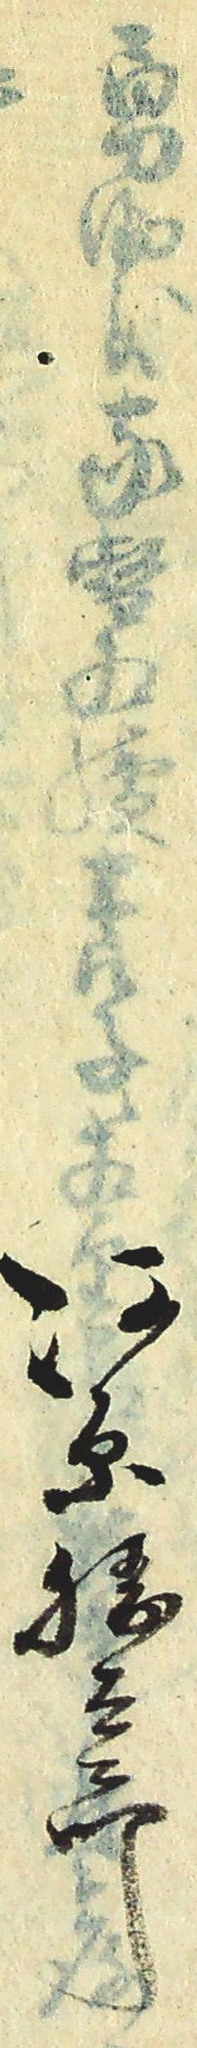河原勝太郎
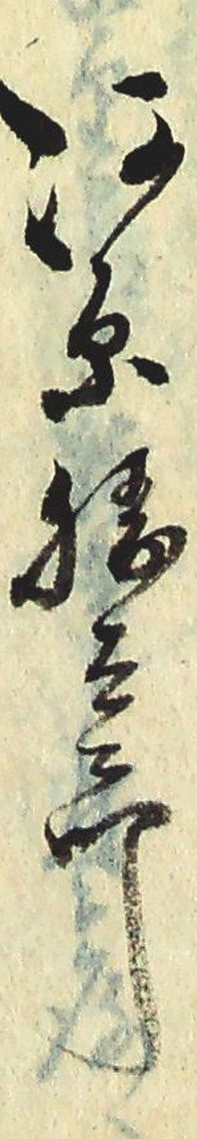河原勝太郎
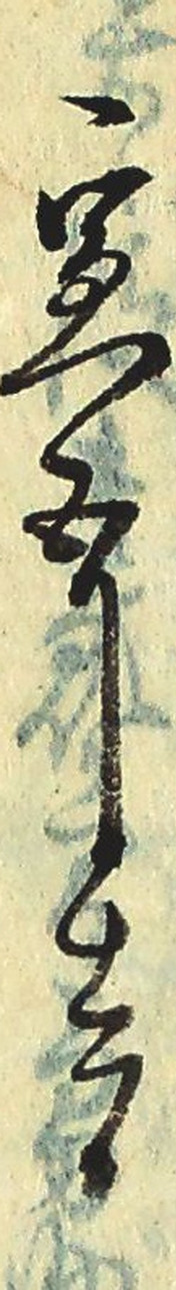寅五月十二日
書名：諸御願書控(弐番）
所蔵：鳴門教育大学 Naruto University of Education
